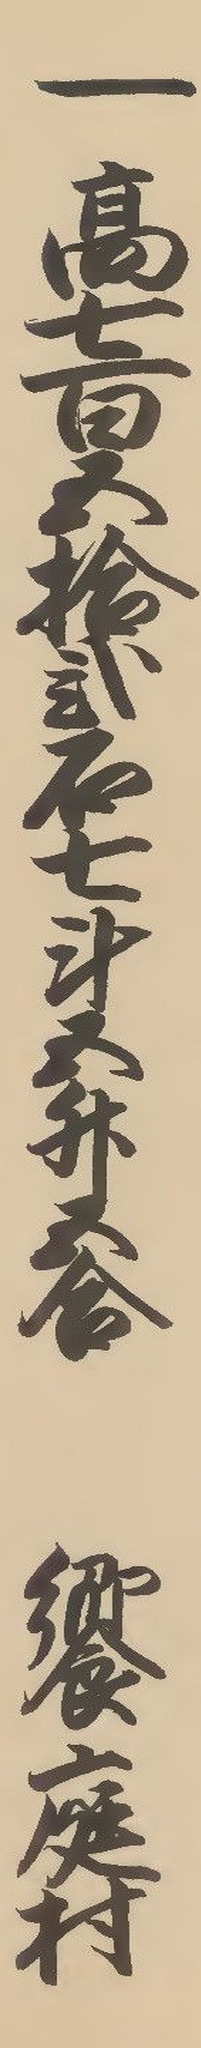一高七百五拾弐石七斗五升五合饗庭村
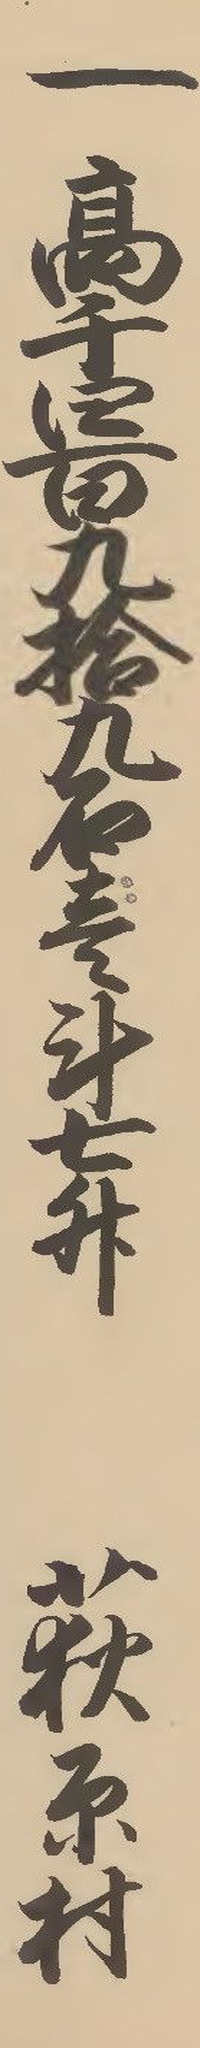一高千四百九拾九石壱斗七升荻原村
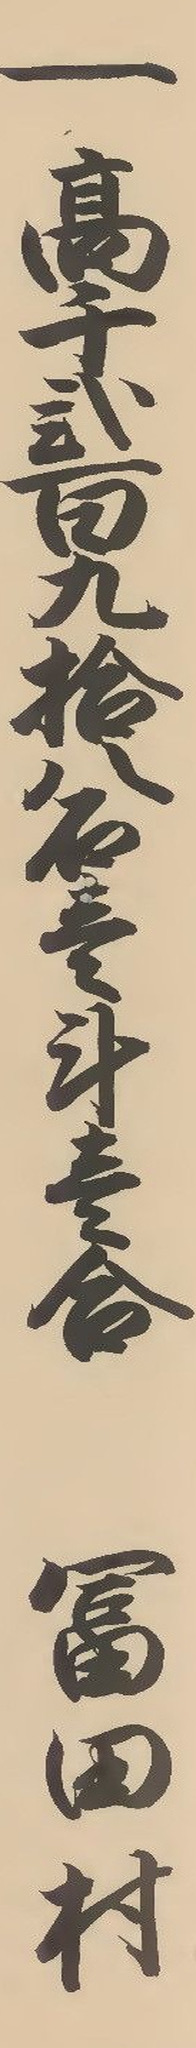一高千弐百九拾八石壱斗壱合富田村
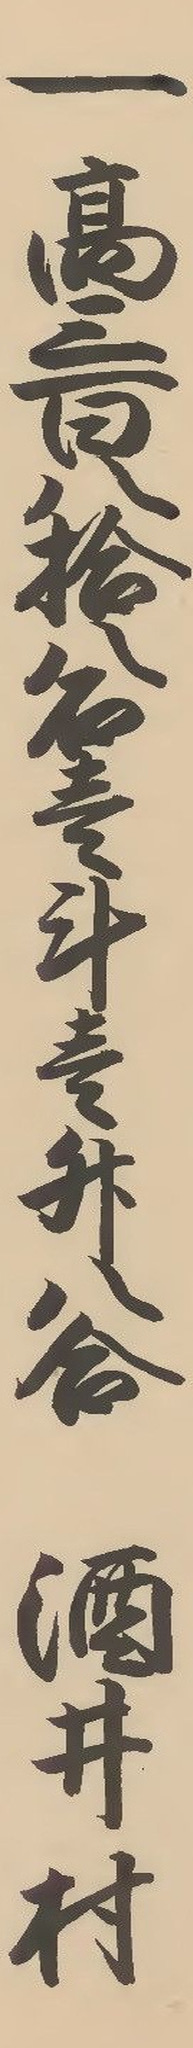一高三百八拾八石壱斗壱升八合酒井村
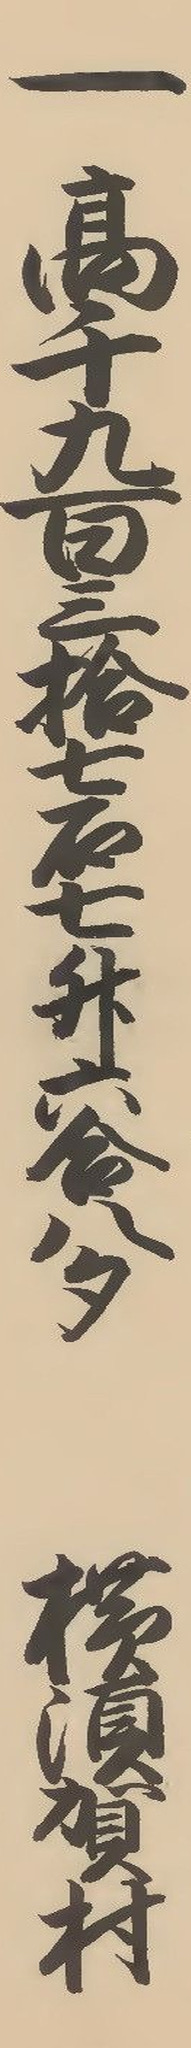一高千九百三拾七石七升六合八勺横須賀村
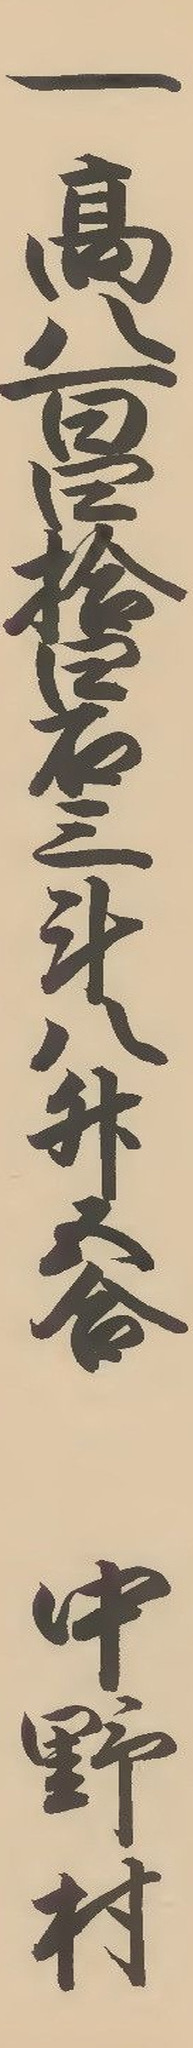一高八百四拾四石三斗八升五合中野村

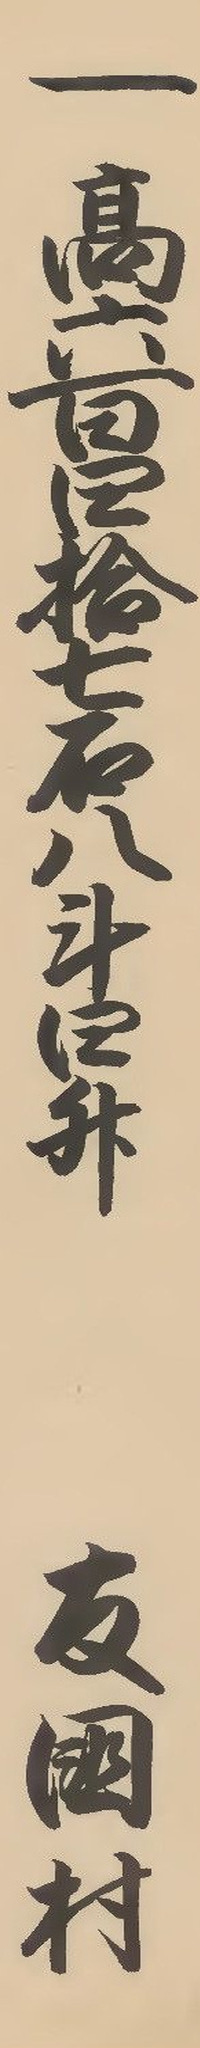一高六百四拾七石八斗四升友国村
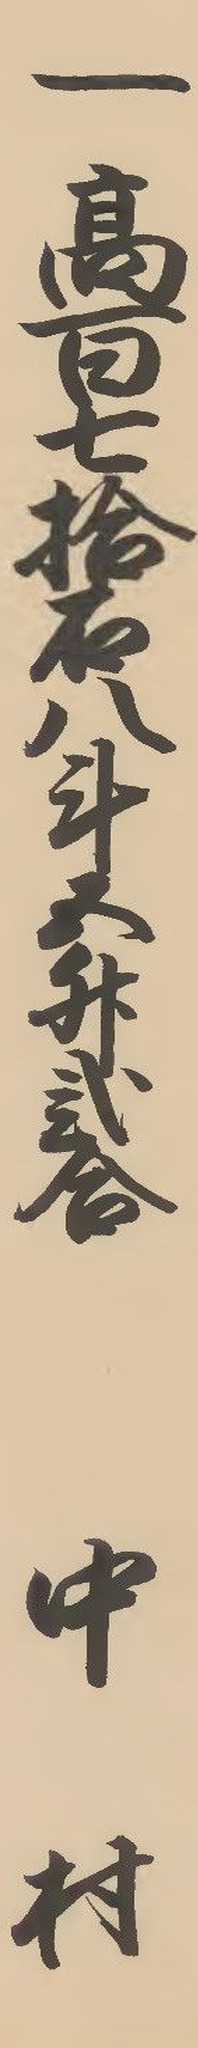一高百七拾石八斗五升弐合中村
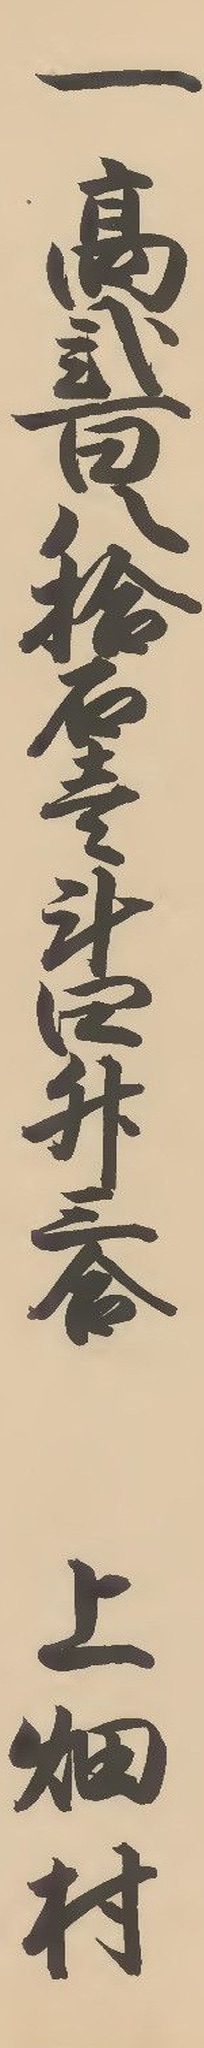一高弐百八拾石壱斗四升三合上畑村
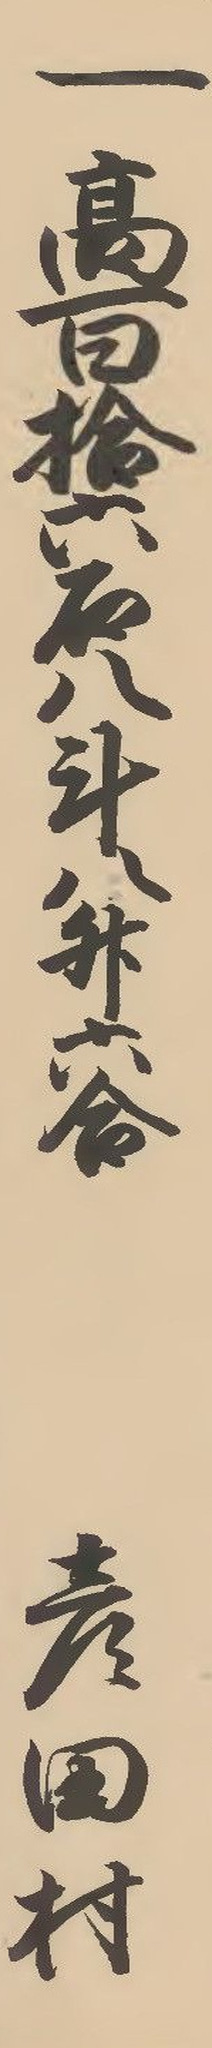一高百拾六石八斗八升六合彦田村
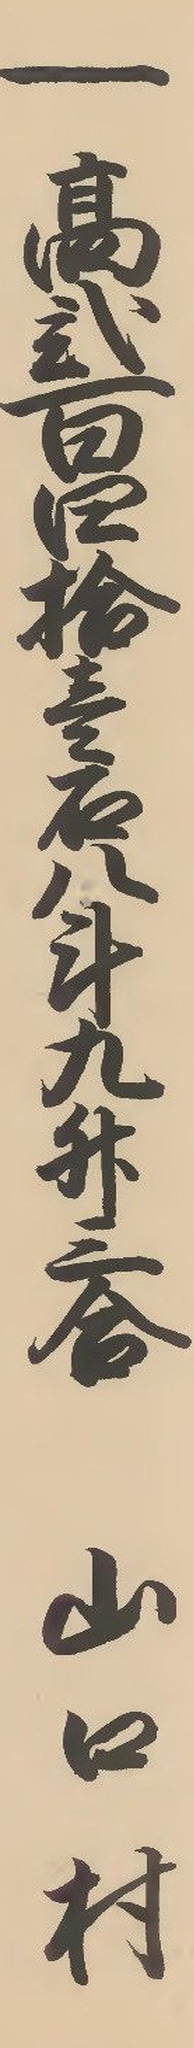一高弐百四拾壱石八斗九升三合山口村
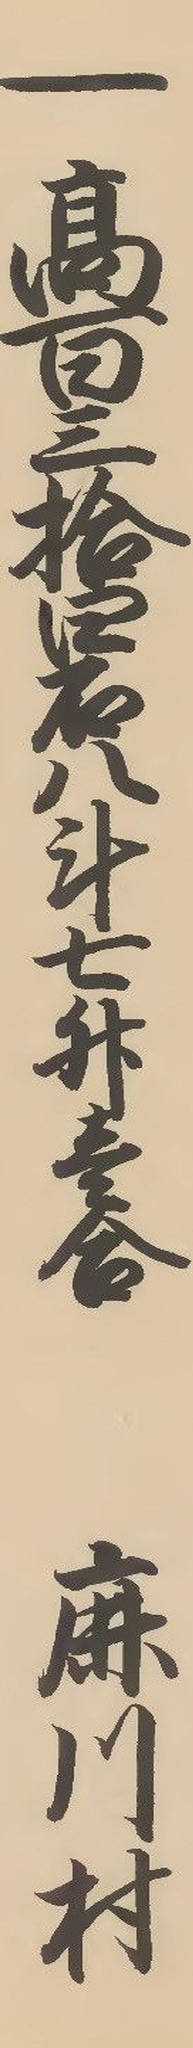一高百三拾四石八斗七升壱合鹿川村
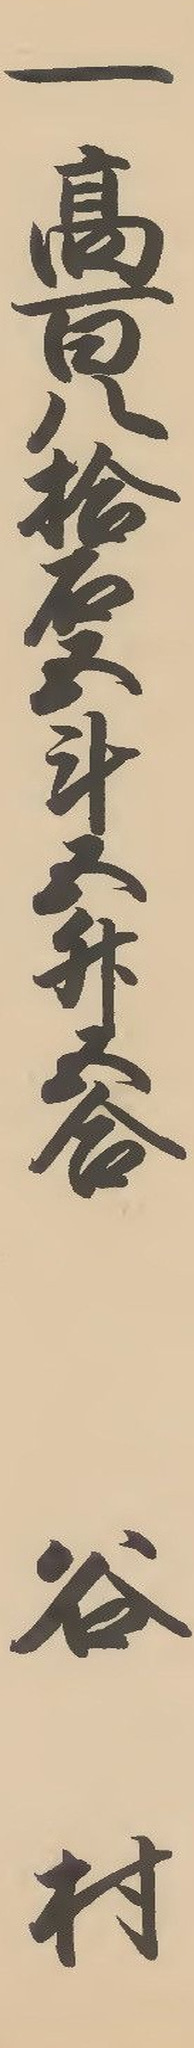一高百八拾石五斗五升五合谷村
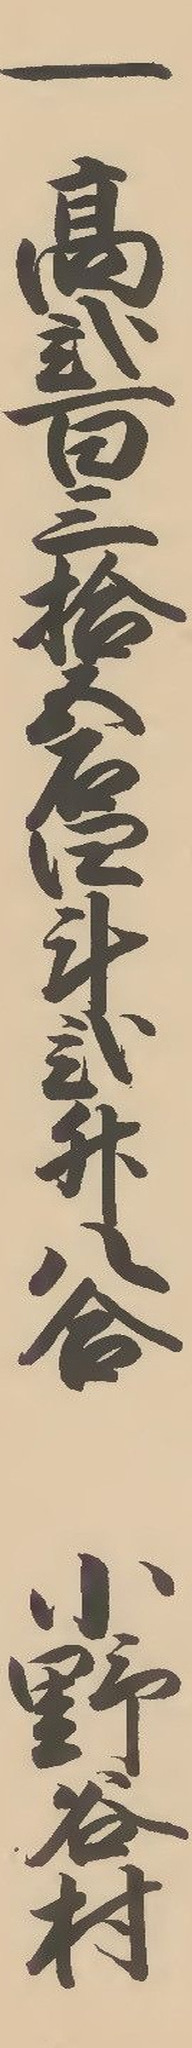一高弐百三拾五石四斗弐升八合小野谷村

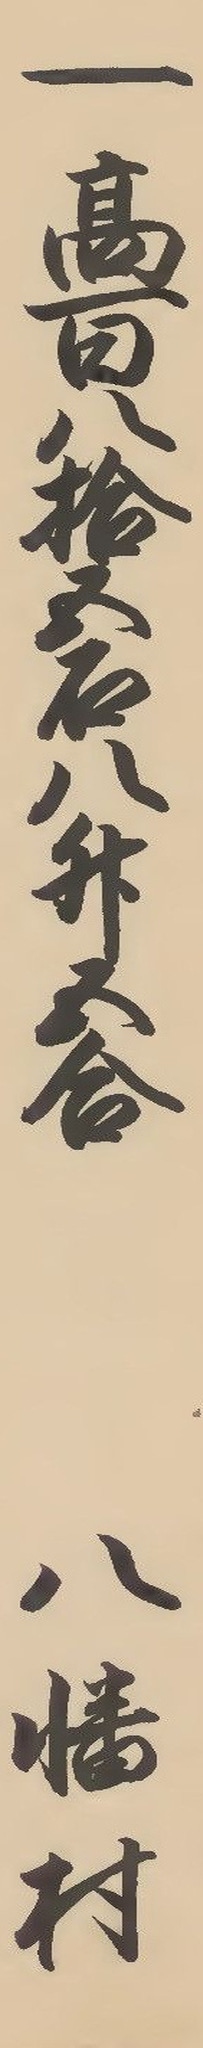一高百八拾五石八升五合八幡村
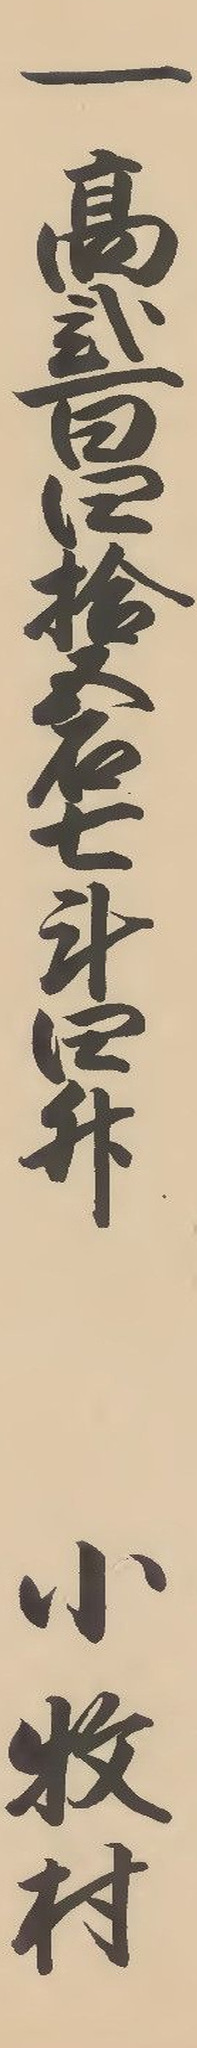一高弐百四拾五石七斗四升小牧村
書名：三河国郷帳
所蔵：国立公文書館 National Archives of Japan
